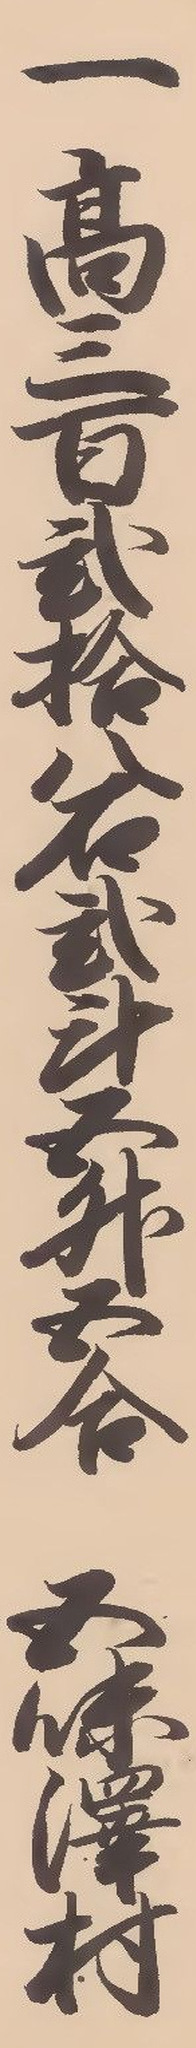一高三百弐拾八石弐斗五升五合五味沢村
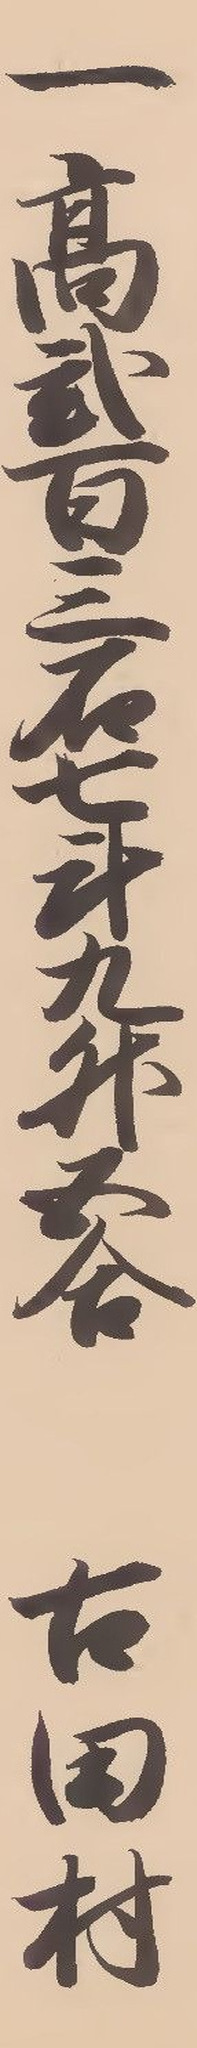一高弐百三石七斗九升五合古田村
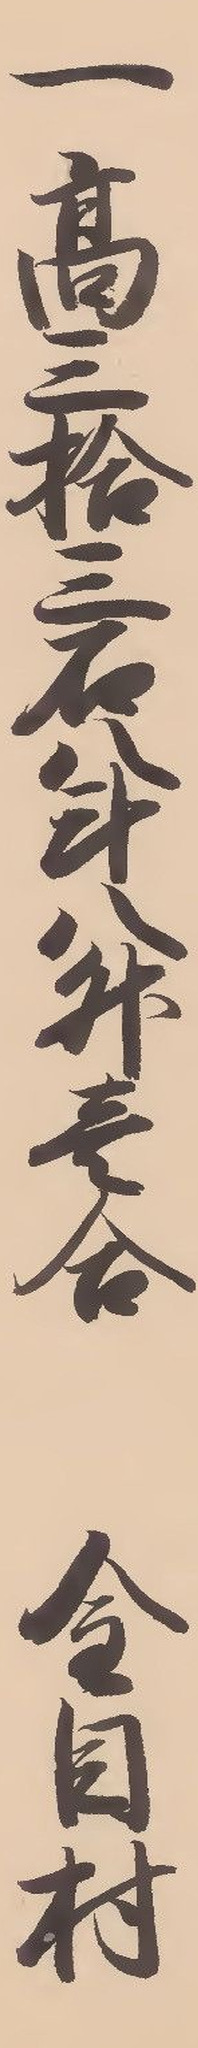一高三拾三石八斗八升壱合金目村
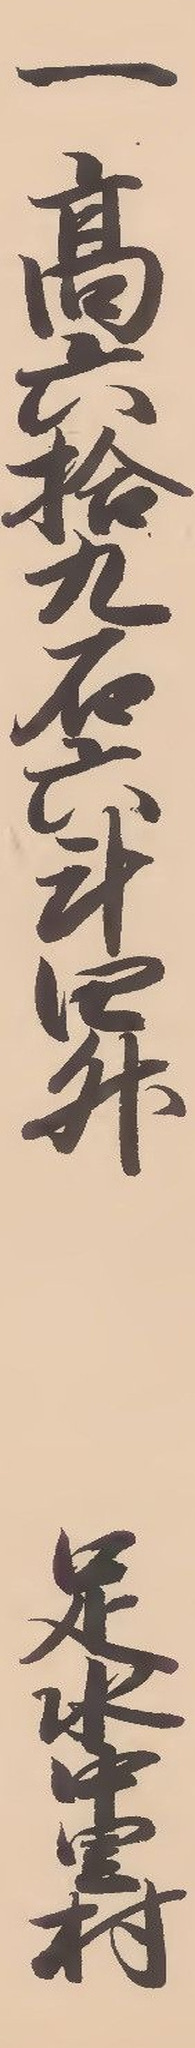一高六拾九石六斗四升足水中里村
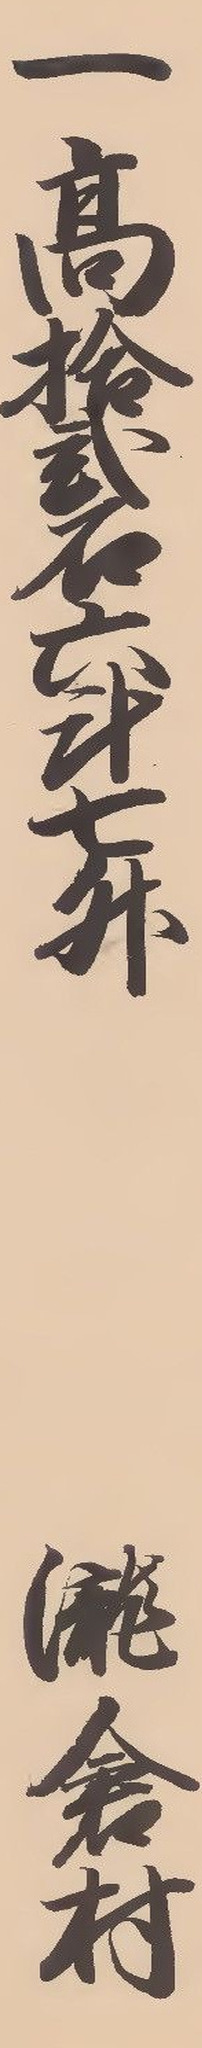一高拾弐石六斗七升滝倉村
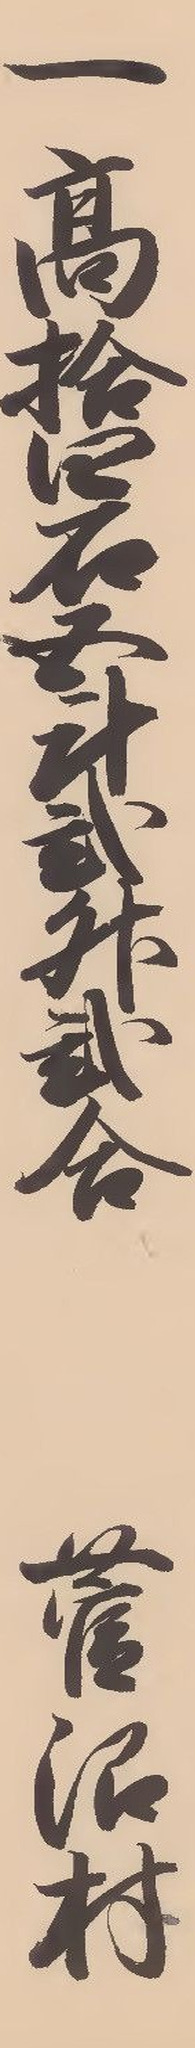一高拾四石五斗弐升弐合菅沼村
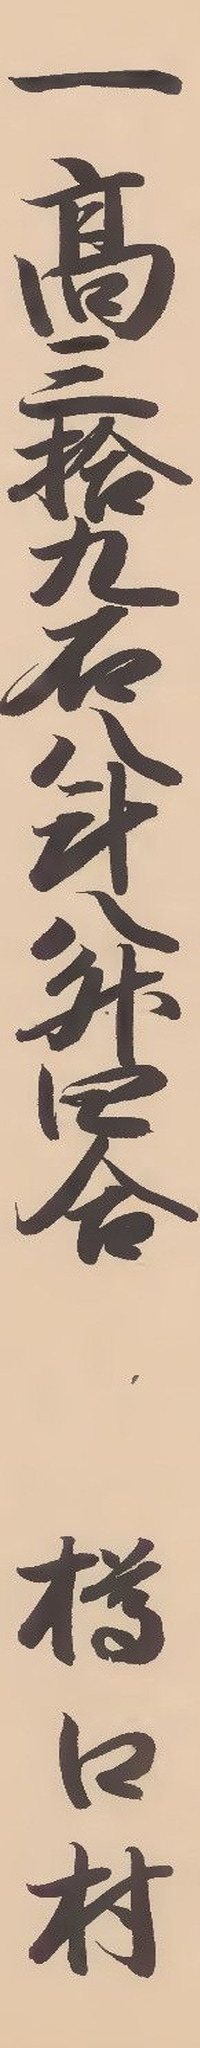一高三拾九石八斗八升四合樽口村
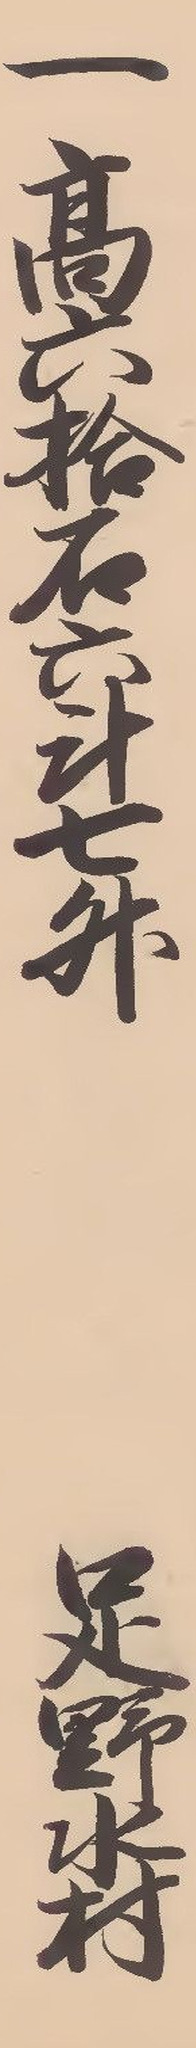一高六拾石六斗七升足野水村

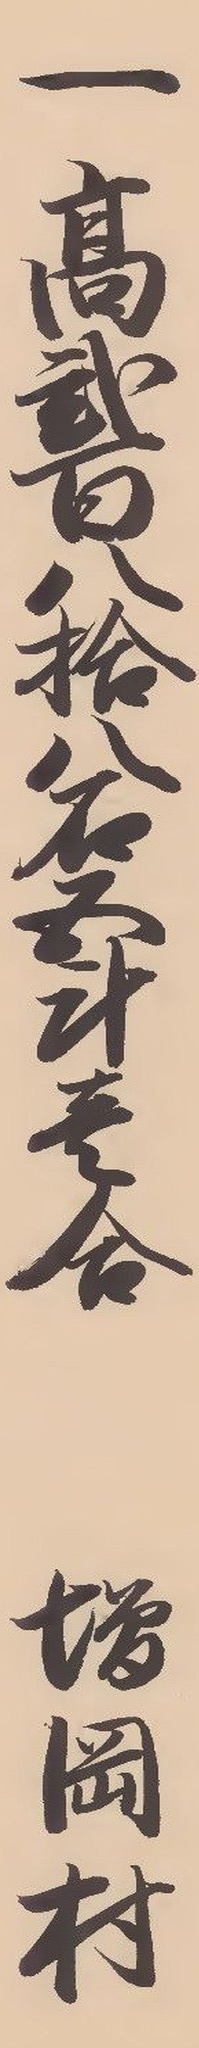一高弐百八拾八石五斗壱合増岡村
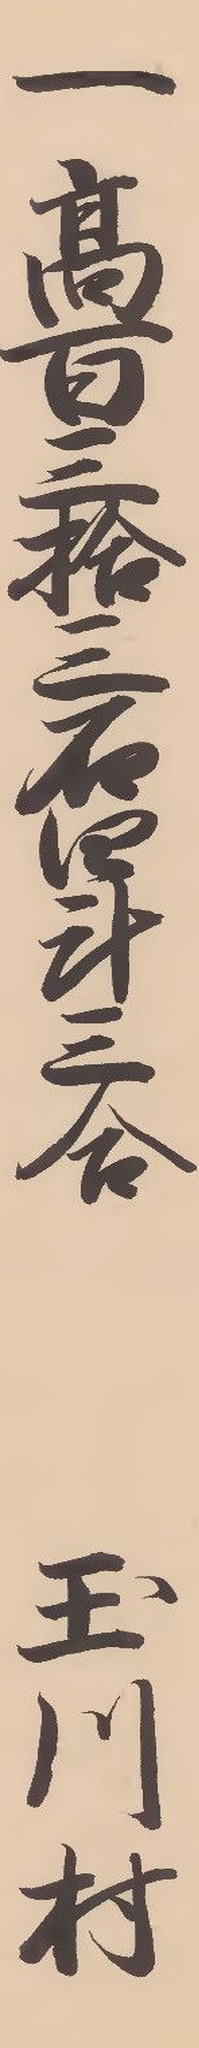一高百三拾三石四斗三合玉川村
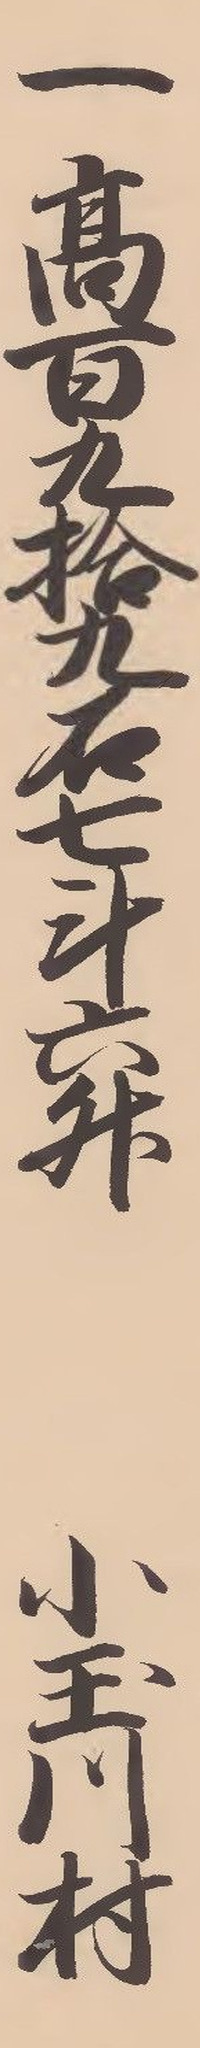一高百九拾九石七斗六升小玉川村
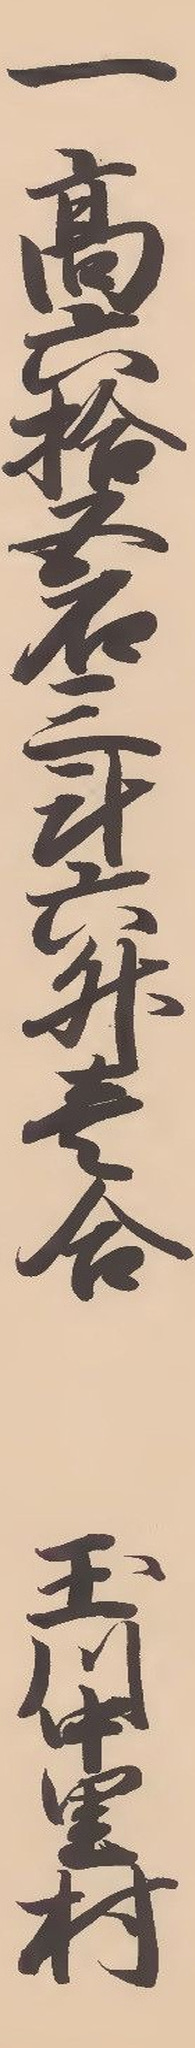一高六拾五石三斗六升壱合玉川中里村
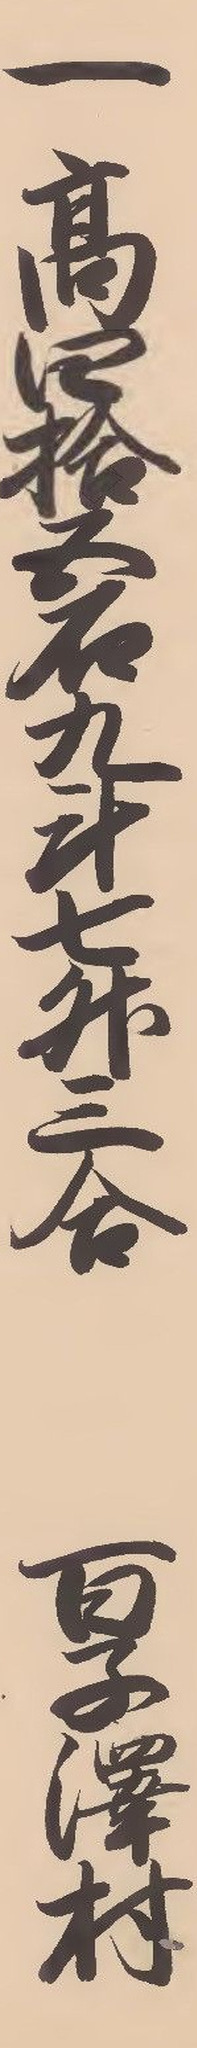一高四拾五石九斗七升三合百子沢村
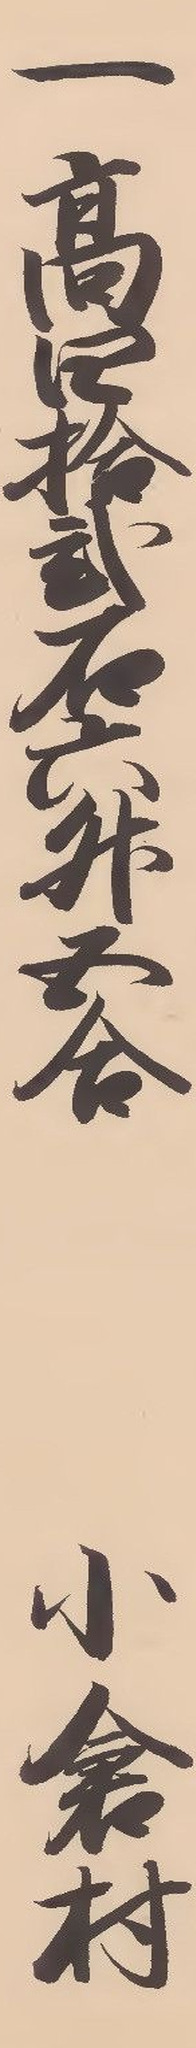一高四拾弐石六升五合小倉村
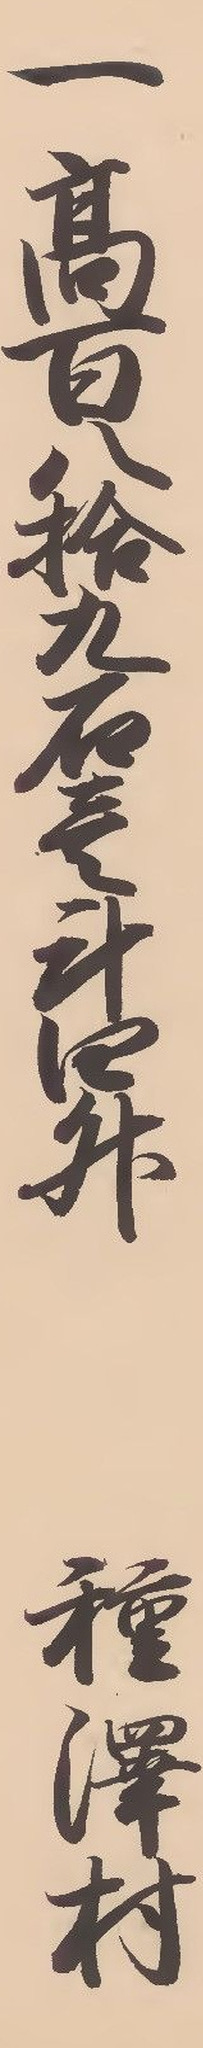一高百八拾九石壱斗四升種沢村

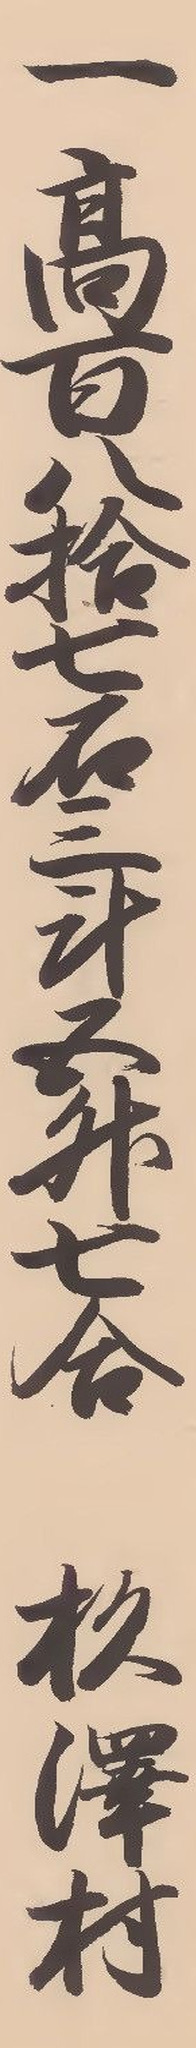一高百八拾七石三斗五升七合杉沢村
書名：出羽国郷帳　１
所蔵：国立公文書館 National Archives of Japan
